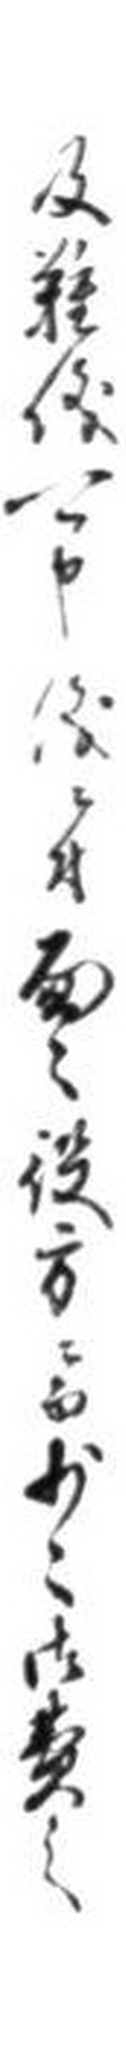及難儀可申儀ニ付面々役方ニ而少々御費之
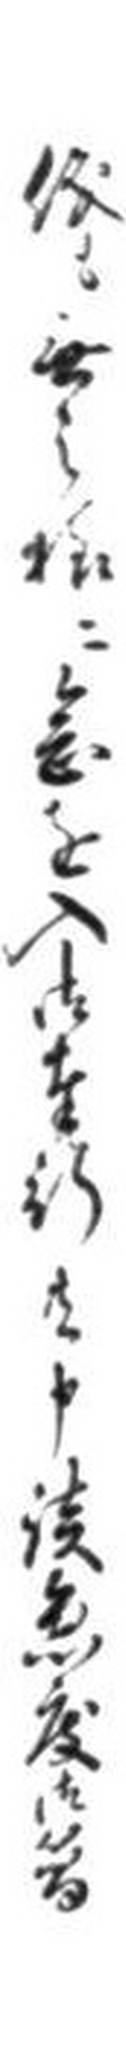儀も無之様ニ念を入御奉行共申談急度御簡
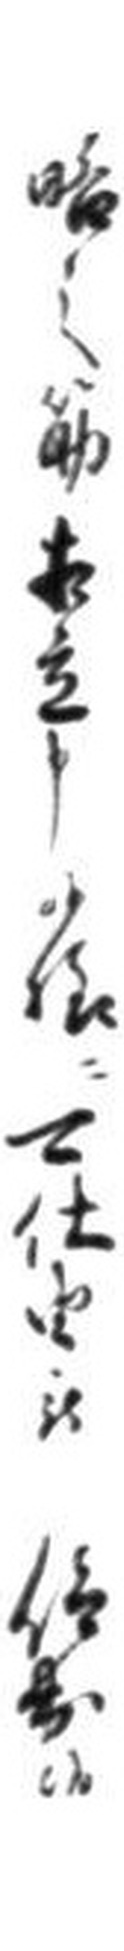略之筋相立申候様ニ可仕由被仰出候
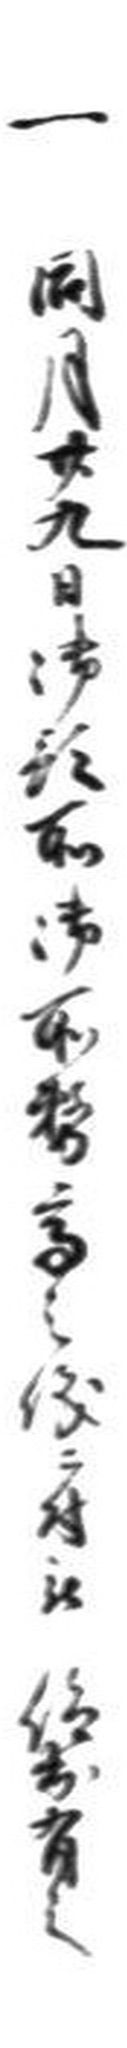一同月廿九日御預所御所務高之儀ニ付被仰出有之
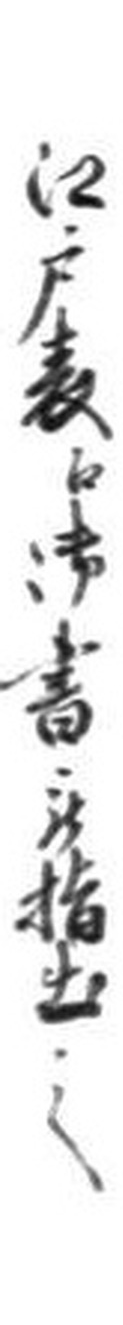江戸表江御書被指出之
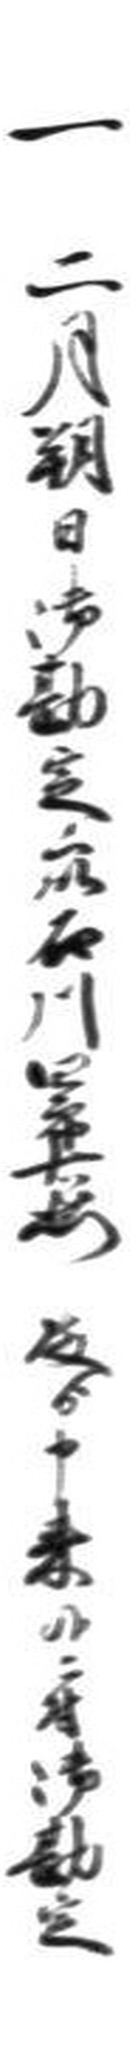一二月朔日御勘定衆石川四郎右衛門殿ゟ申来候ニ付御勘定
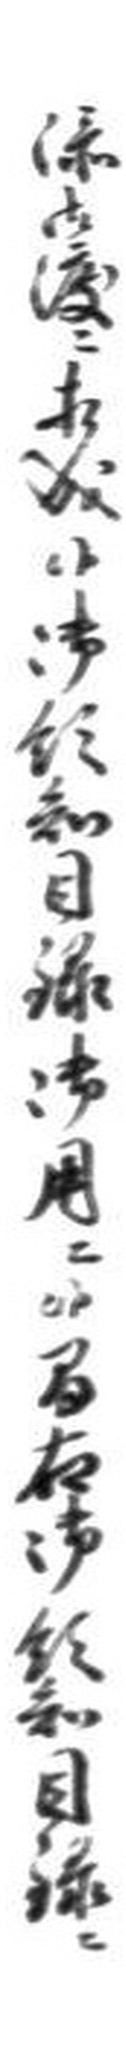添御渡ニ相成候御領知目録御用ニ候間右御領知目録ニ
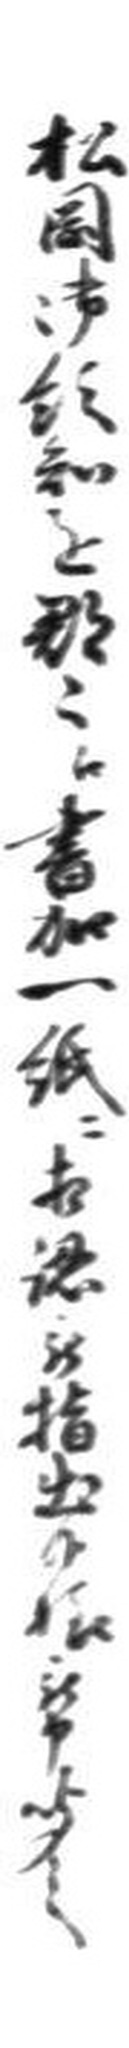松岡御領知を郡々江書加一紙ニ相認被指出候様被申聞之
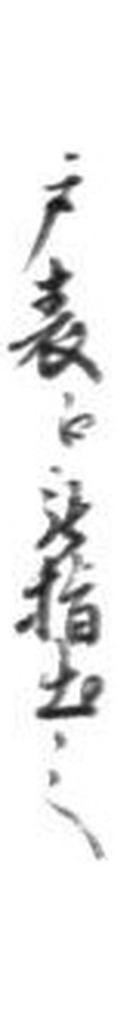戸表江被指出之

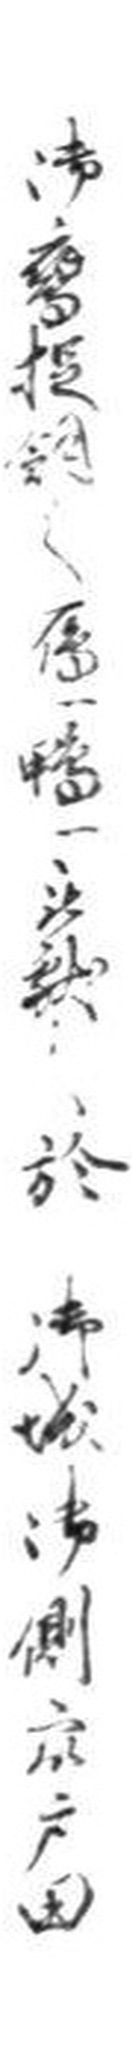御鷹授飼之鳫一鴨一被献之於御城御側衆戸田
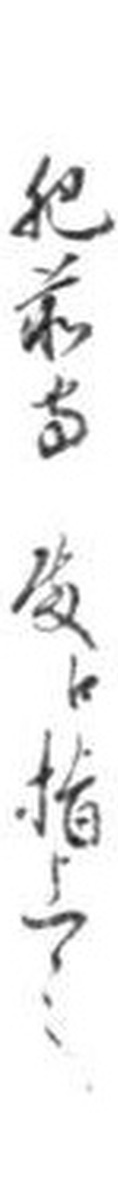肥前守殿江指上之
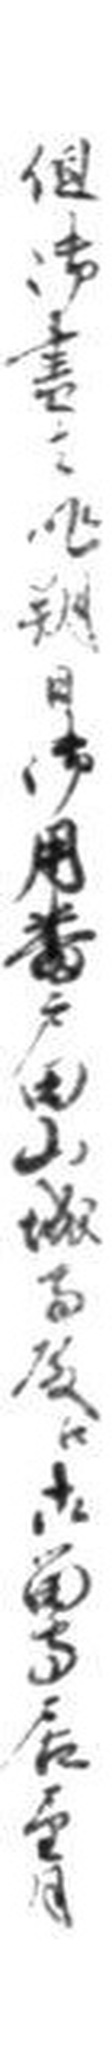但御書を昨朔日御用番戸田山城守殿江御留守居望月
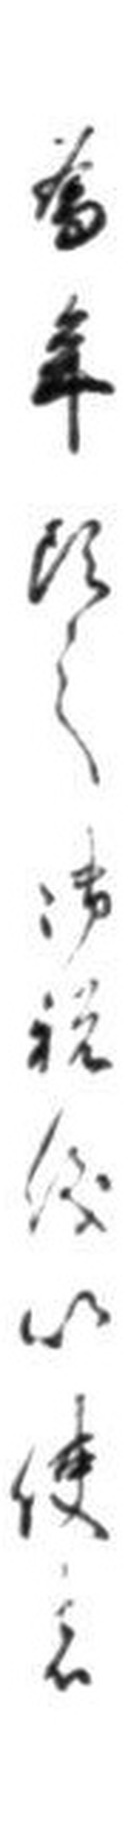為年頭之御祝儀以使者
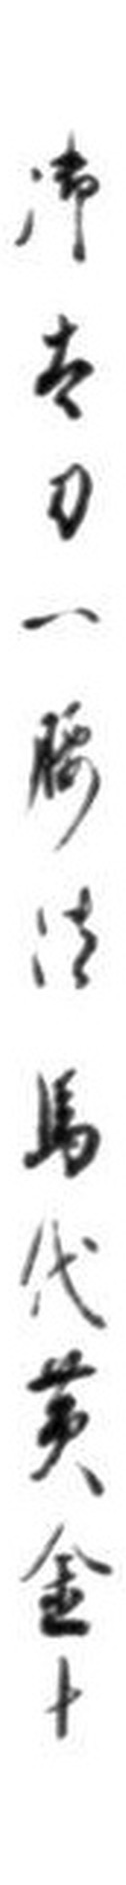御太刀一腰御馬代黄金十
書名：家譜 三十六 宗昌公 従享保八年到同九年
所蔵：福井県文書館 Fukui Prefectural Archives
